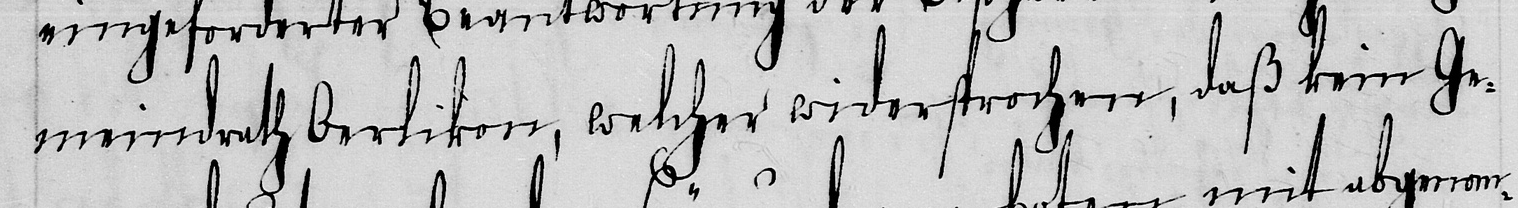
meindrath Oerlikon, welcher widersprochen, daß kein Ge¬
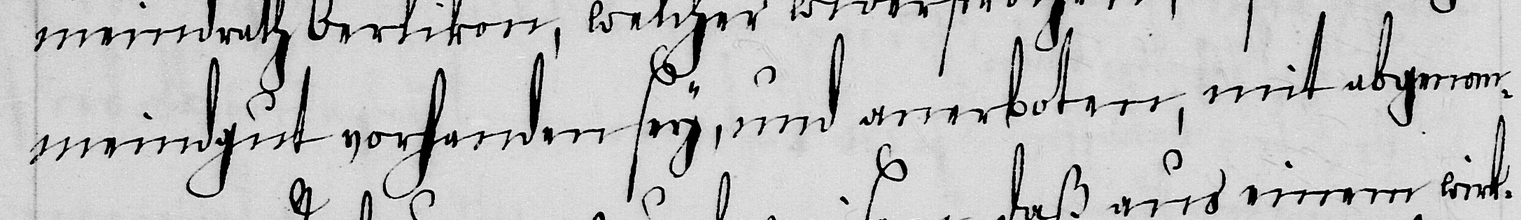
meindgut vorhanden sey, und anerboten, mit abgenom¬
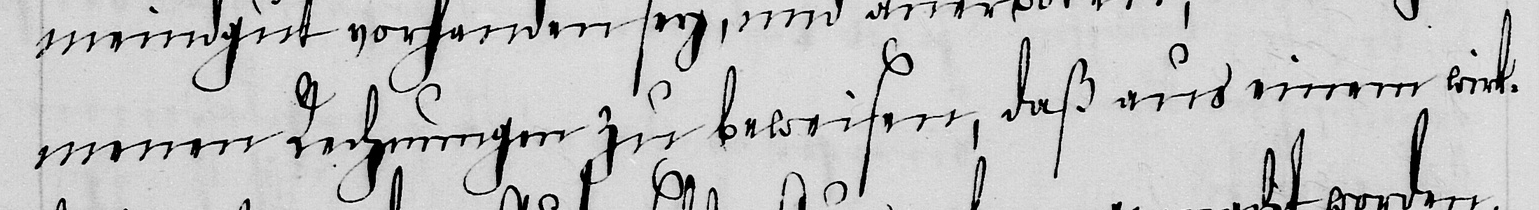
menen Rechnungen zu beweisen, daß aus einem wirk¬
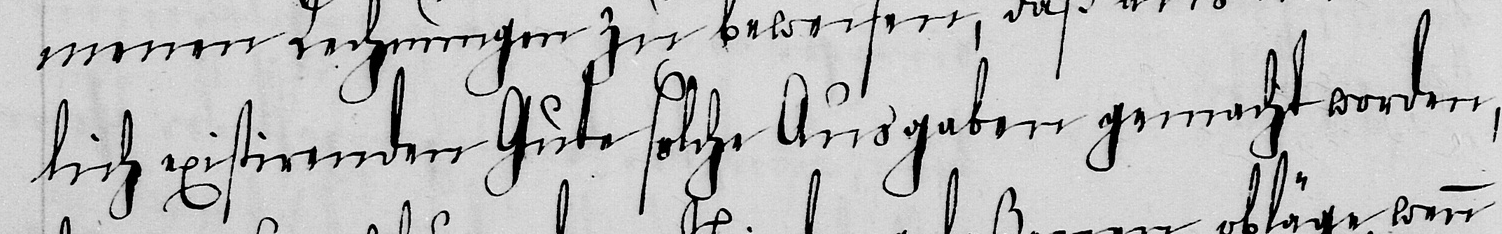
lich existirenden Gute solche Ausgaben gemacht worden,
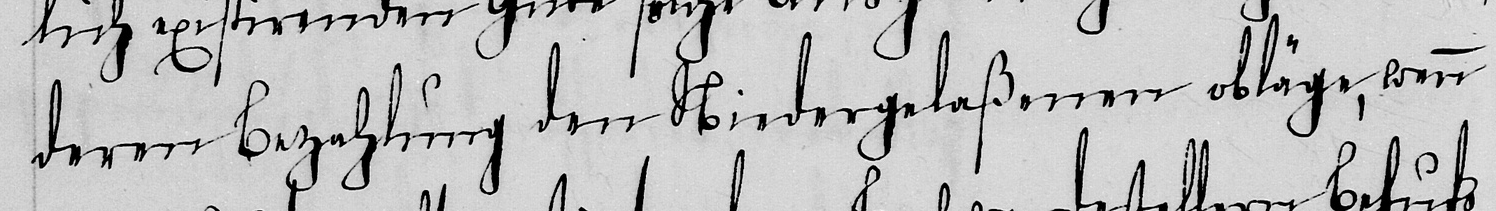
deren Bezahlung den Niedergelaßenen obläge, wenn
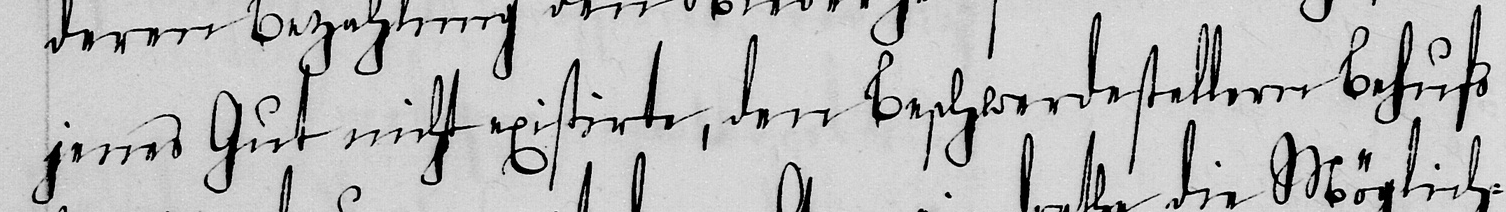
jenes Gut nicht existirte, den Beschwerdestellern Behufs
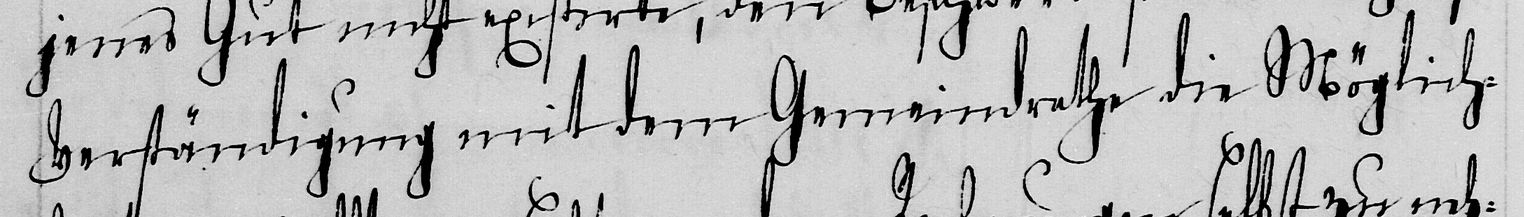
Verständigung mit dem Gemeindrathe die Möglich¬
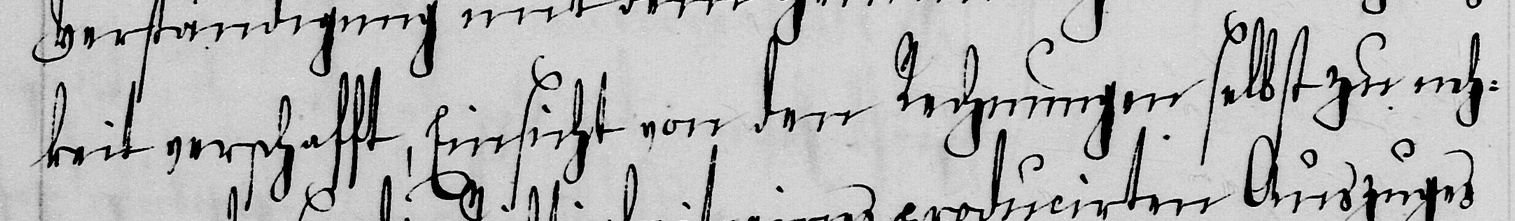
keit verschafft, Einsicht von den Rechnungen selbst zu neh¬
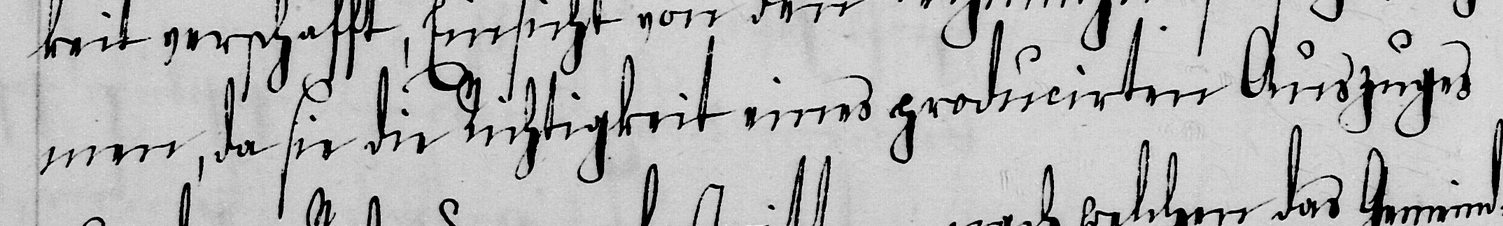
men, da sie die Richtigkeit eines producirten Auszuges
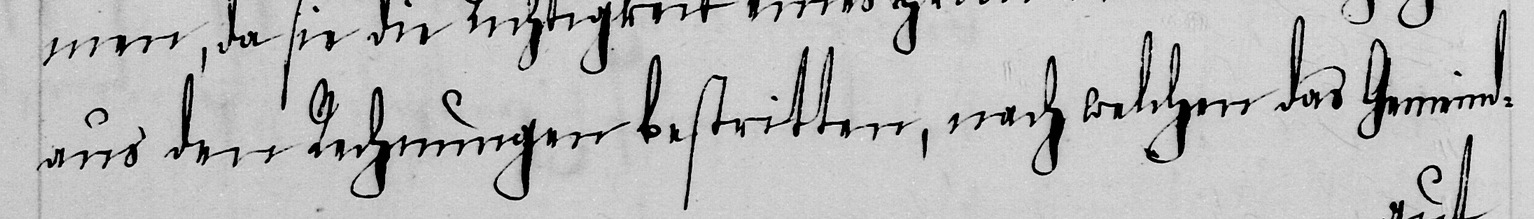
aus den Rechnungen bestritten, nach welchen das Gemeind-
